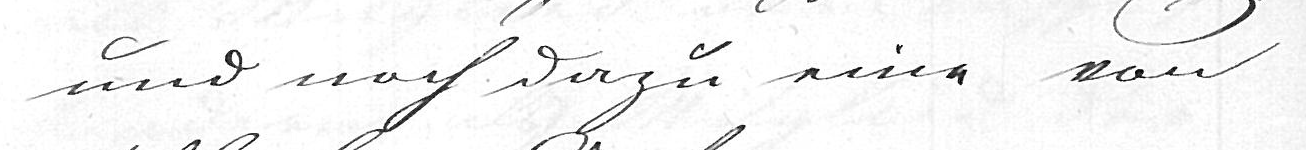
und dazu eine von
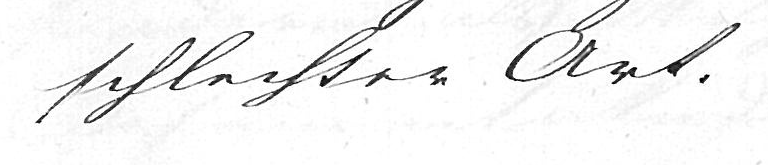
schlechter Art.
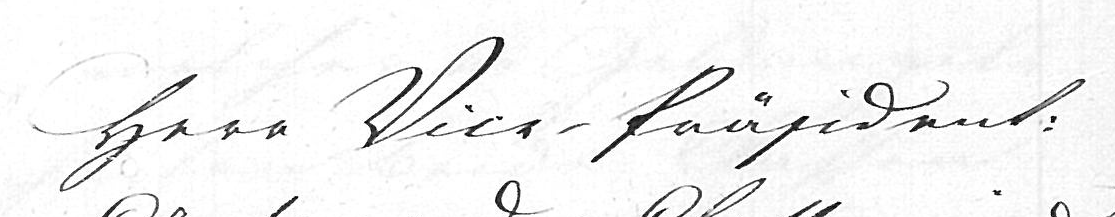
Herr Vice-Präsident:
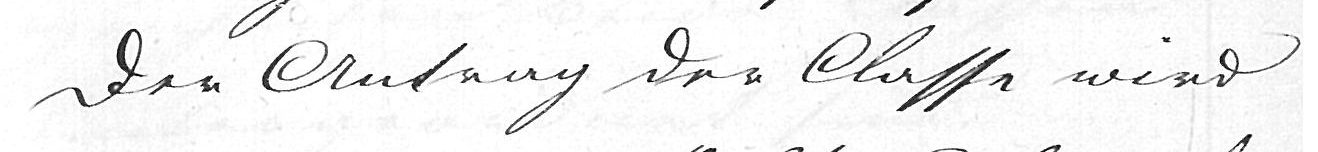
Der Antrag der Classe wird
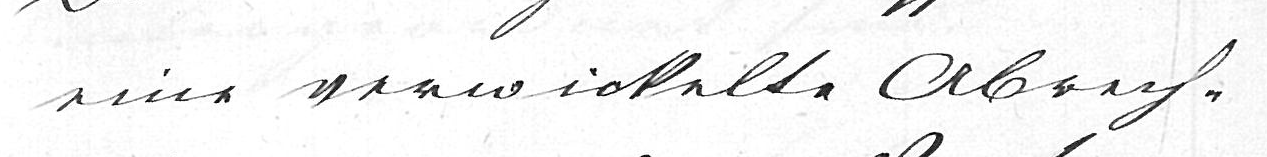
eine verwickelte Abrech-
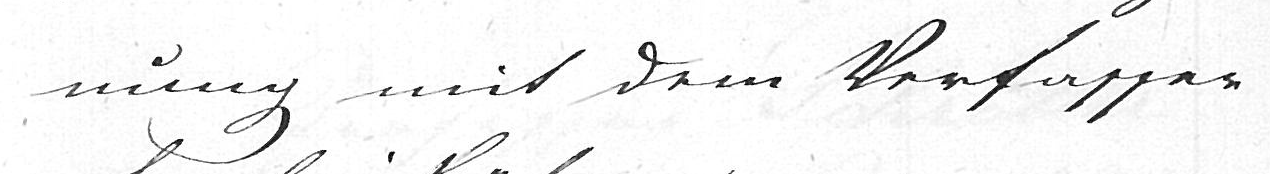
nung mit dem Verfasser
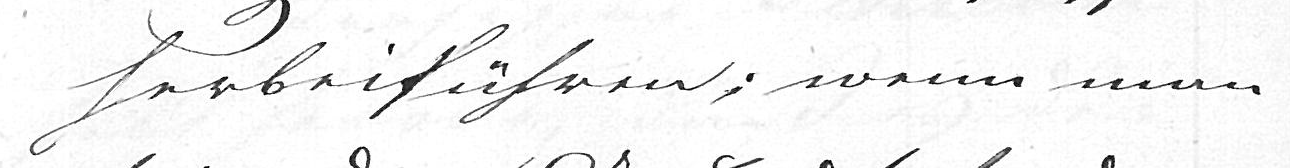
herbeiführen; wenn man
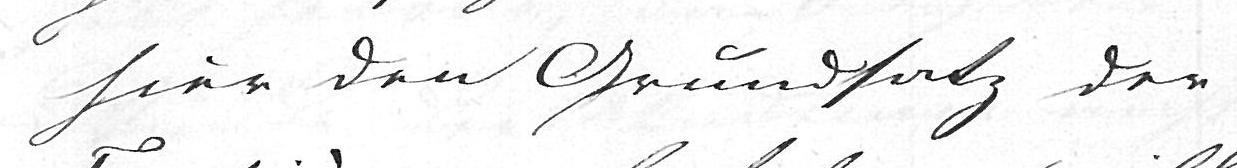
hier den Grundsatz der
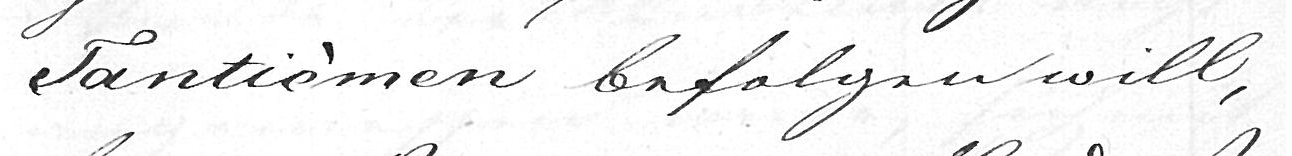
Tantièmen befolgen will,
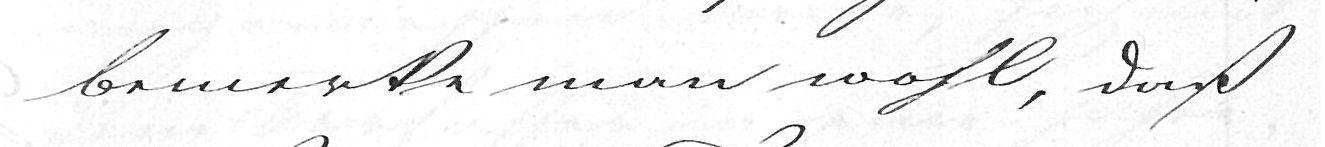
bemerke man wohl, daß
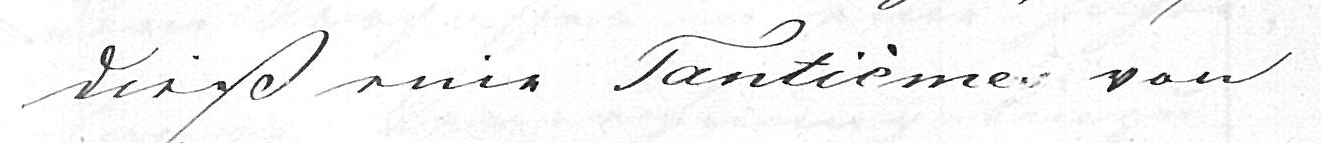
dieß eine Tanième von
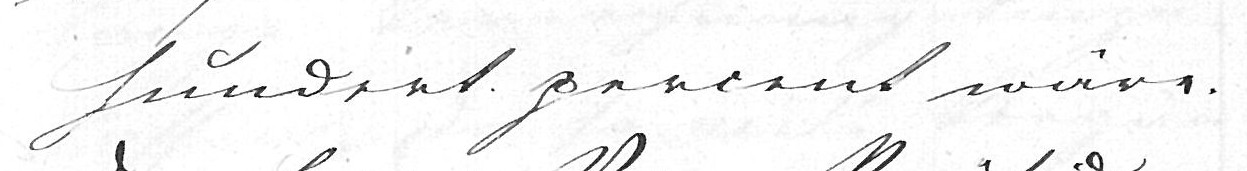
hundert percent wäre.
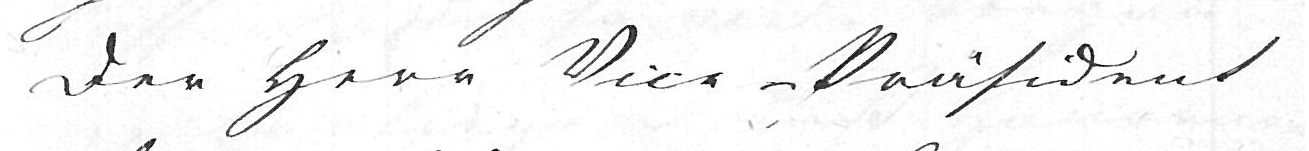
Der Herr Vice-Präsident
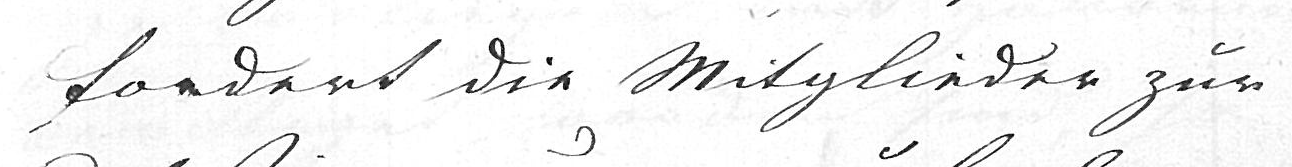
fordert die Mitglieder zur
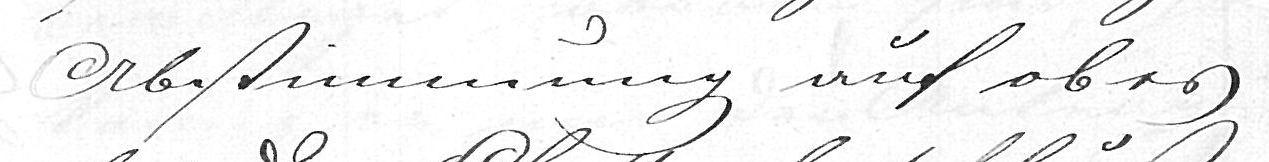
Abstimmung auf ob es
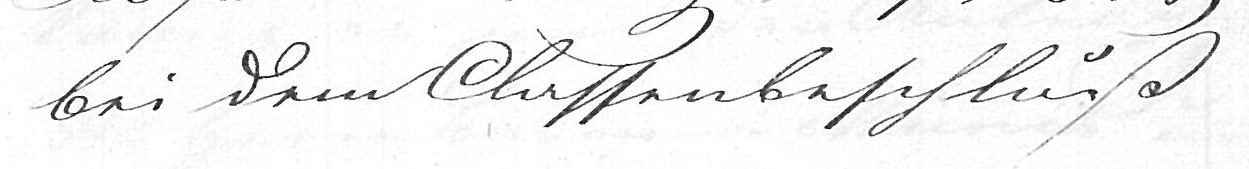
bei dem Classenbeschluß
